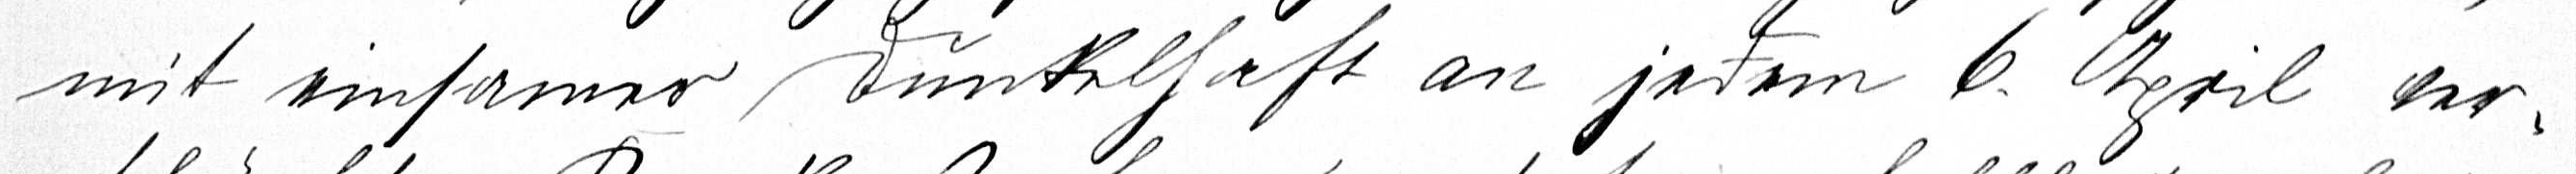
mit einsamer Dunkelhaft an jedem 6. April ver¬
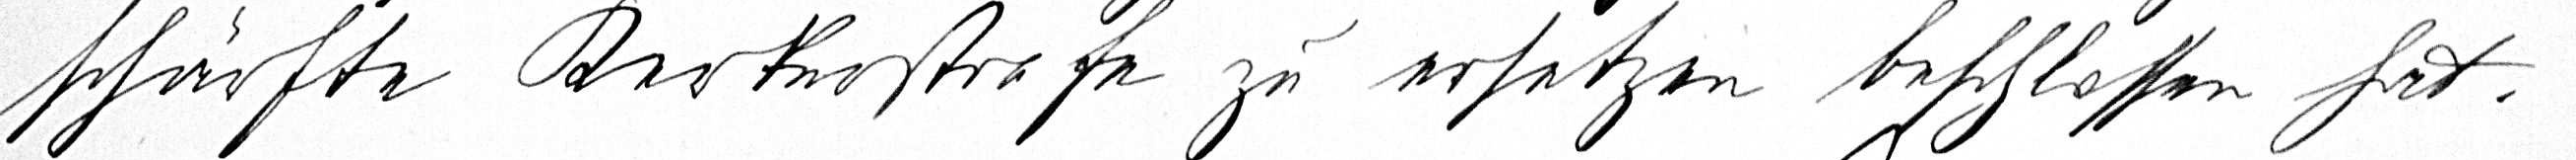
schärfte Kerkerstrafe zu ersetzen beschlossen hat.
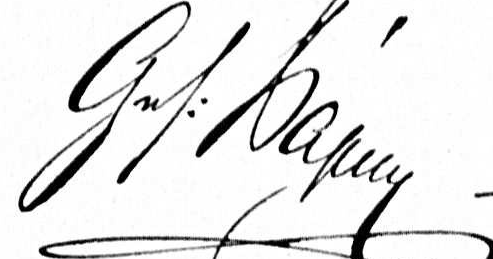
Ges: xx
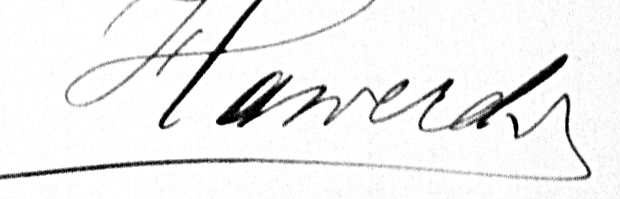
20/10
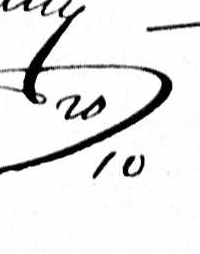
Hawerds
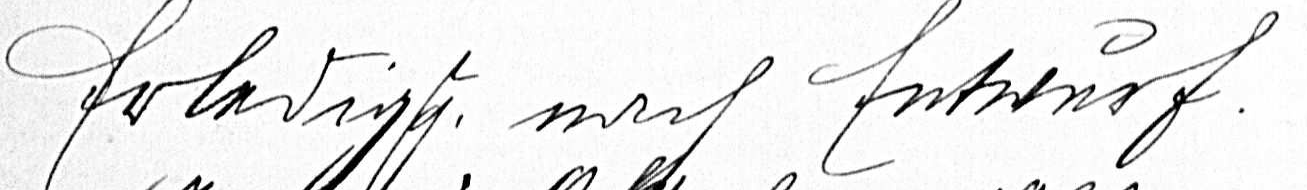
Erledigg. nach Entwurf.
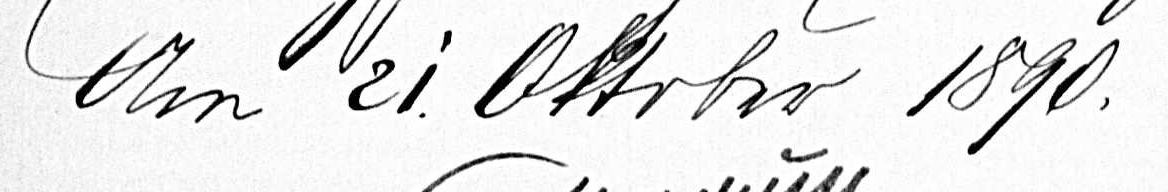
Am 21. Oktober 1890.
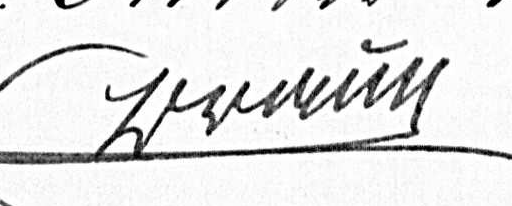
Braun
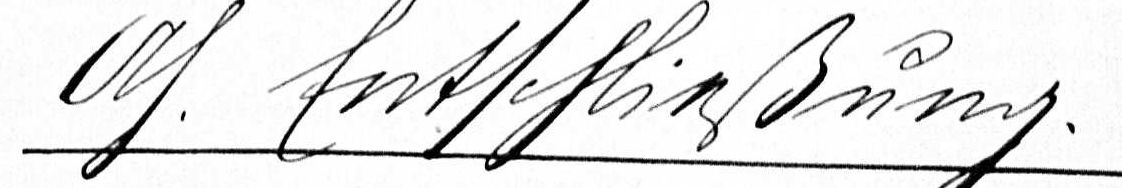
Ah. Entschließung.
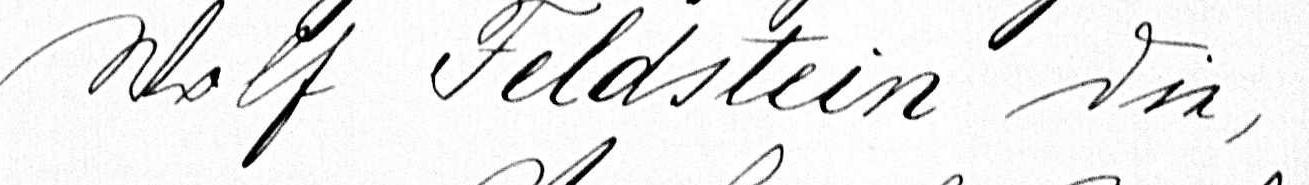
Wolf Feldstein die,
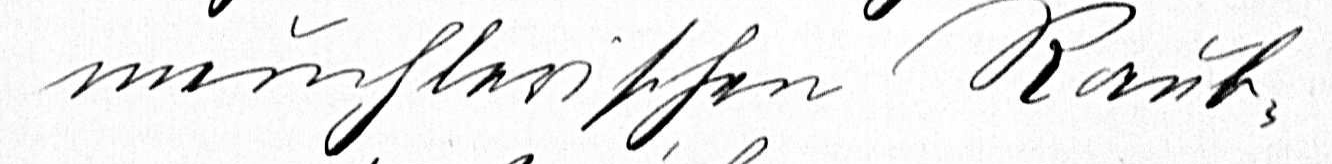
meuchlerischen Raub¬
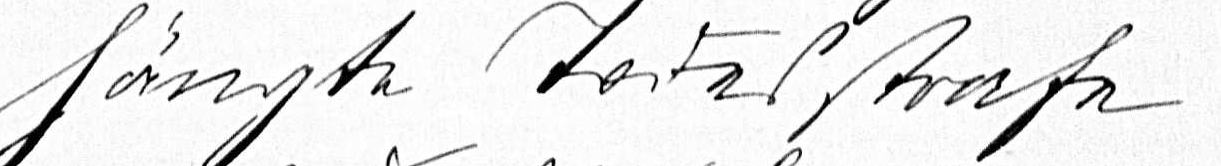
hängte Todesstrafe
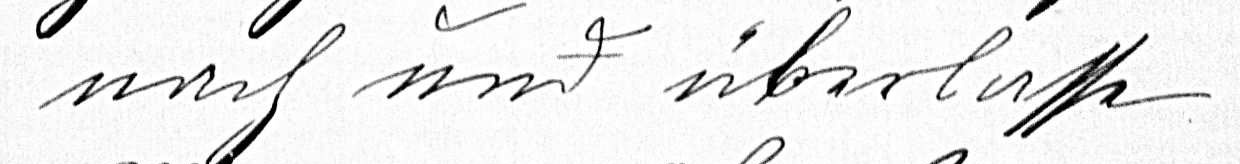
nach und überlasse
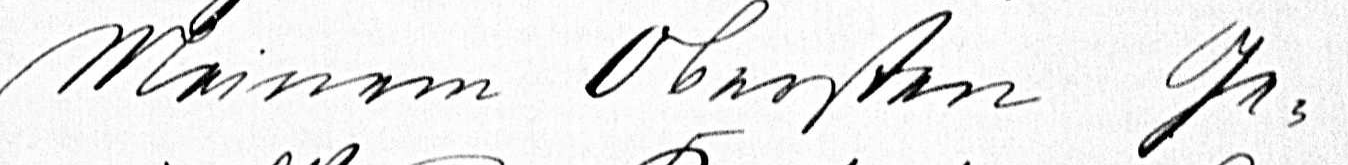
Meinem Obersten Ge¬
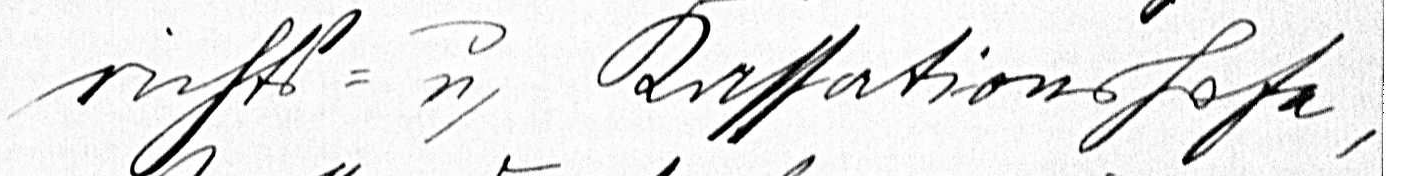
richts= u/ Kassationshofe,
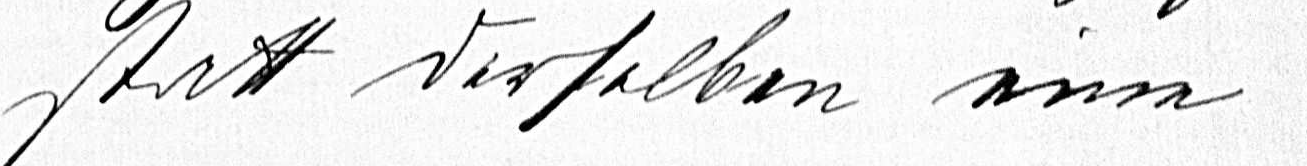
statt derselben eine
